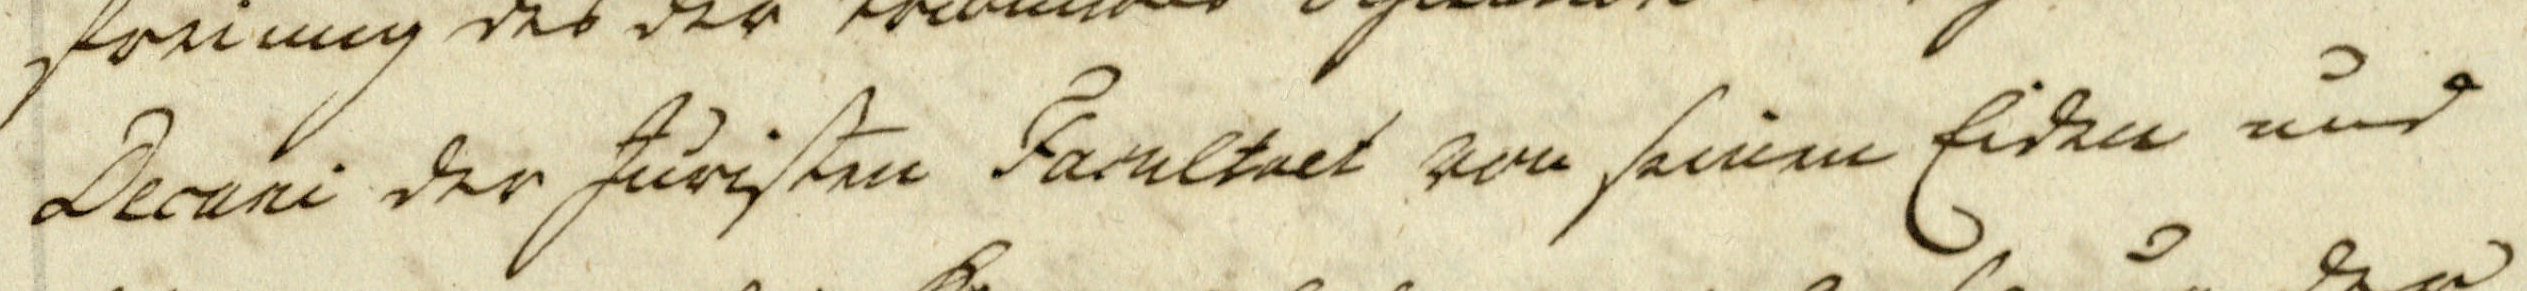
Decani der Juristen Facultaet von seinen Eiden und
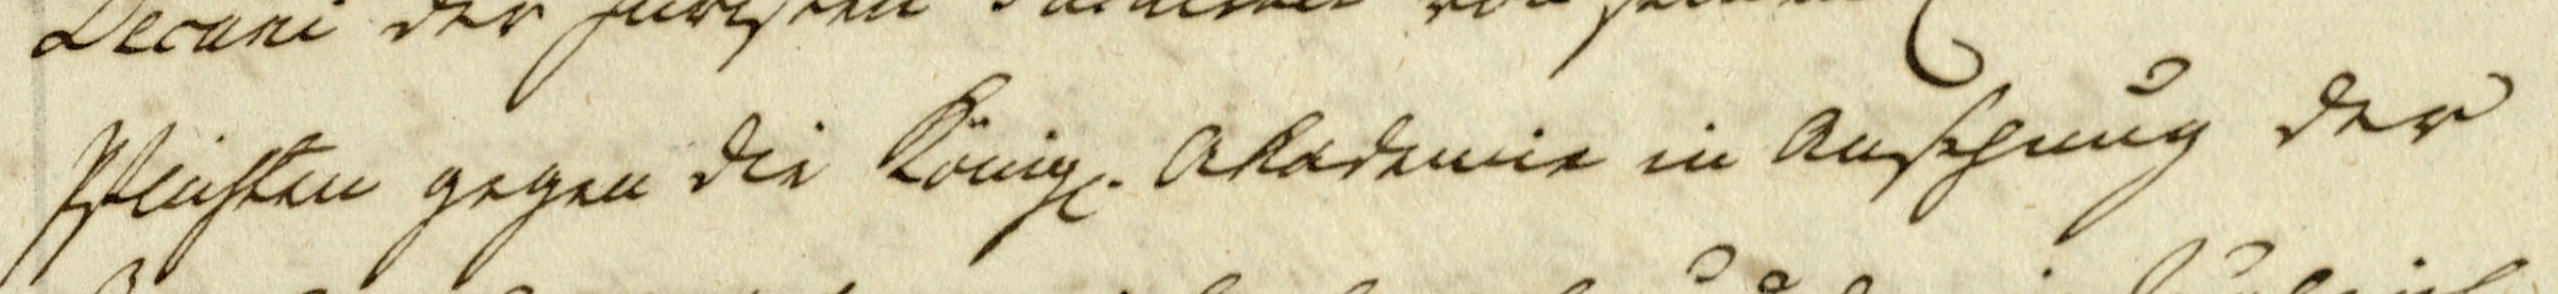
Pflichten gegen die Königl. Akademie in Ansehung der
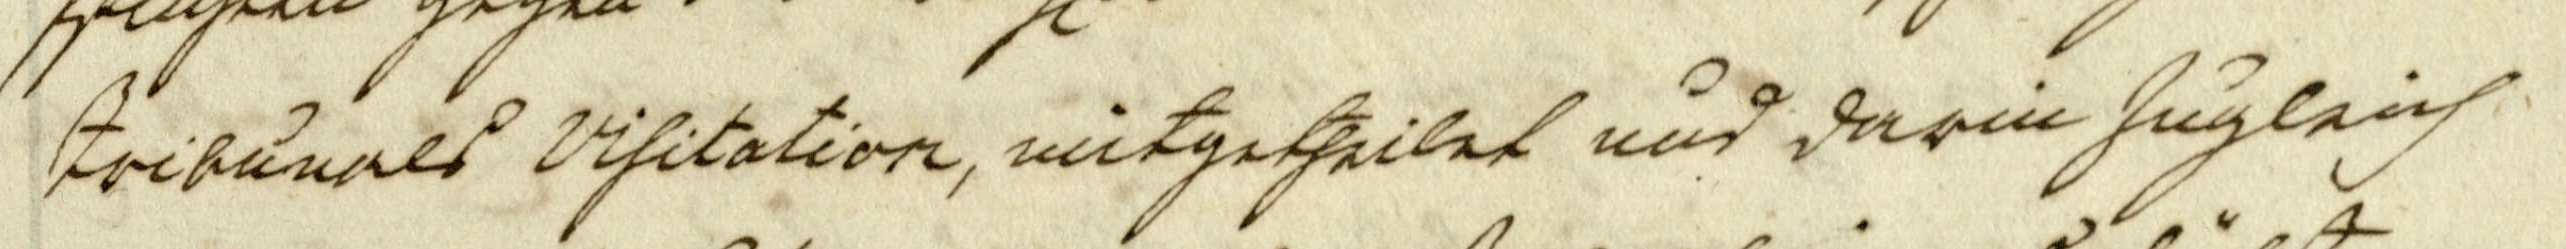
Tribunals Visitation, mitgetheilet und darin zugleich
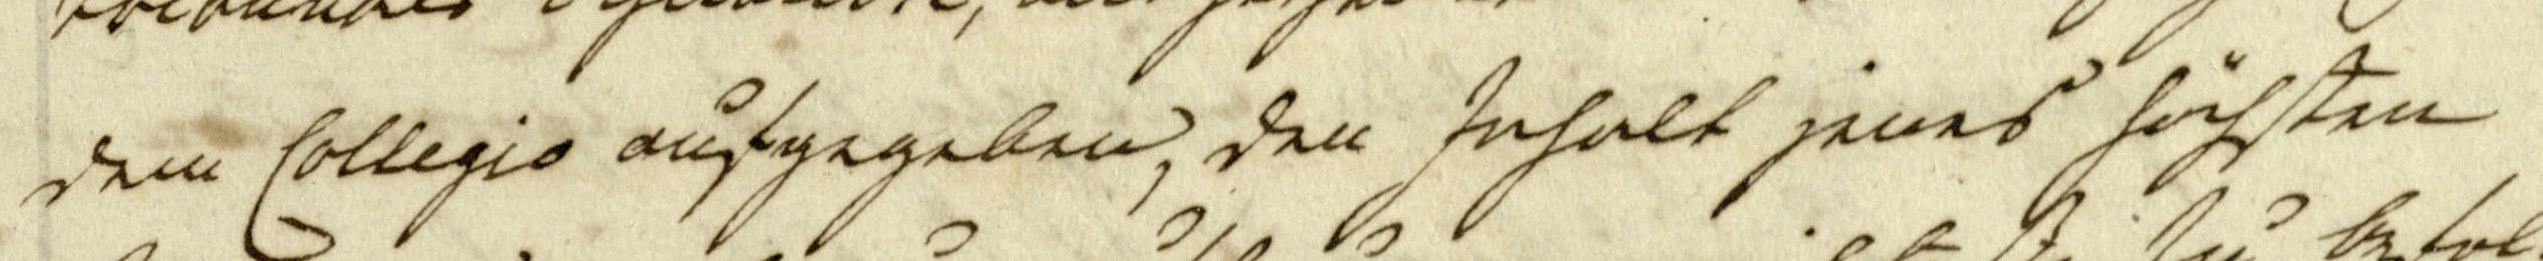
dem Collegio aufgegeben, den Inhalt jenes höchsten
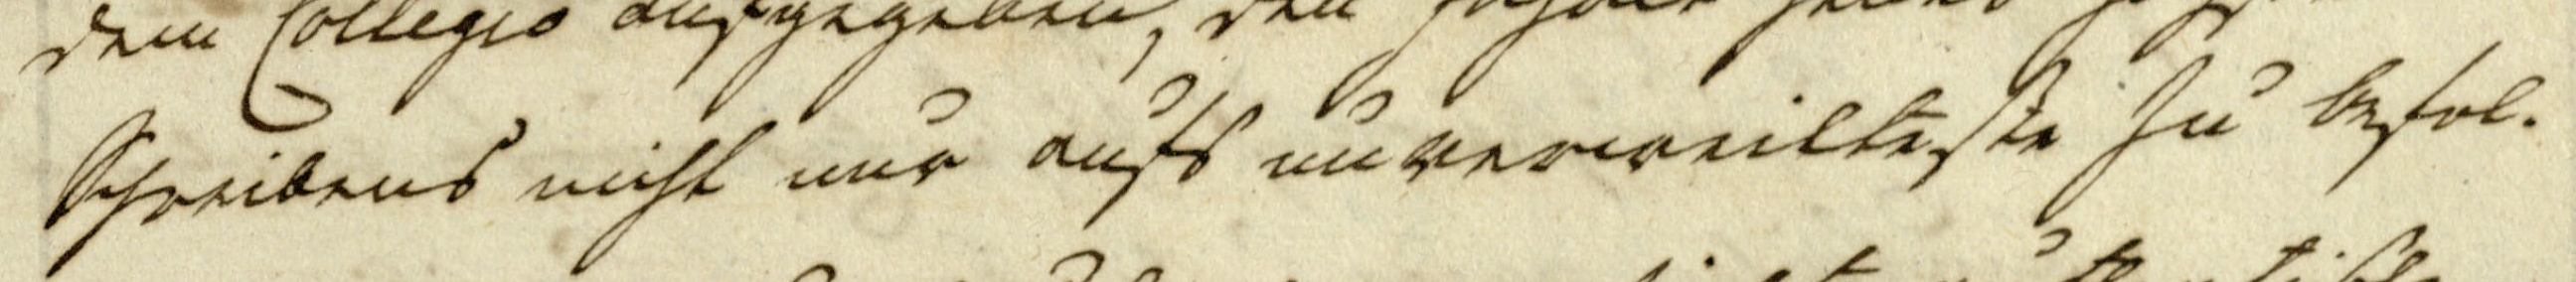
Schreibens nicht nur aufs unverweilteste zu befol¬
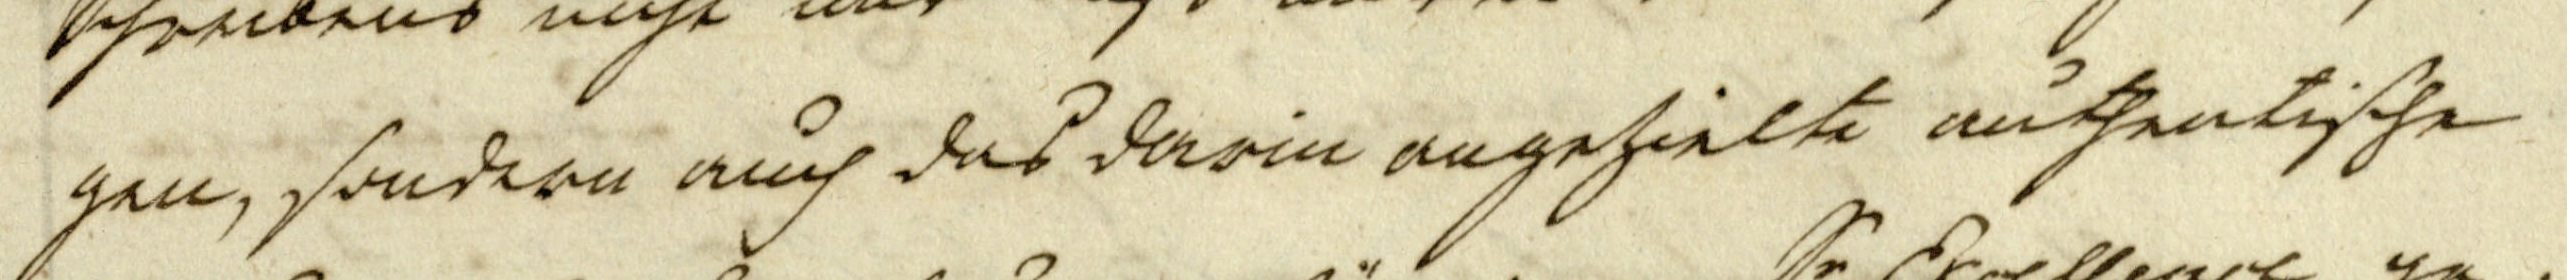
gen, sondern auch das darin angezielte authentische
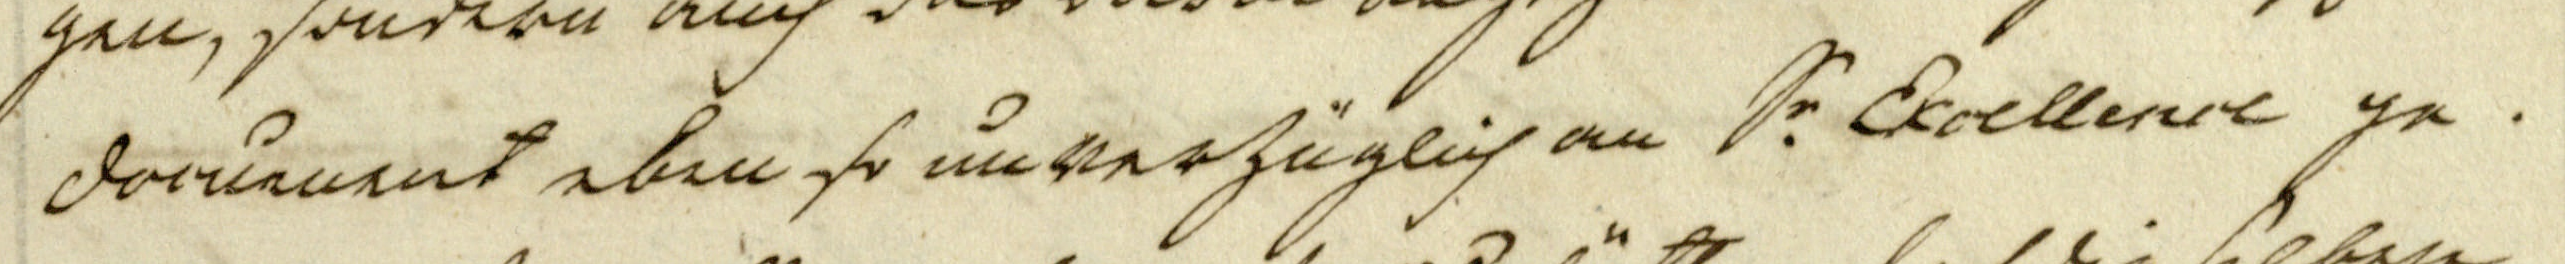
Document ebenso unverzüglich an Sr. Excellence ge¬
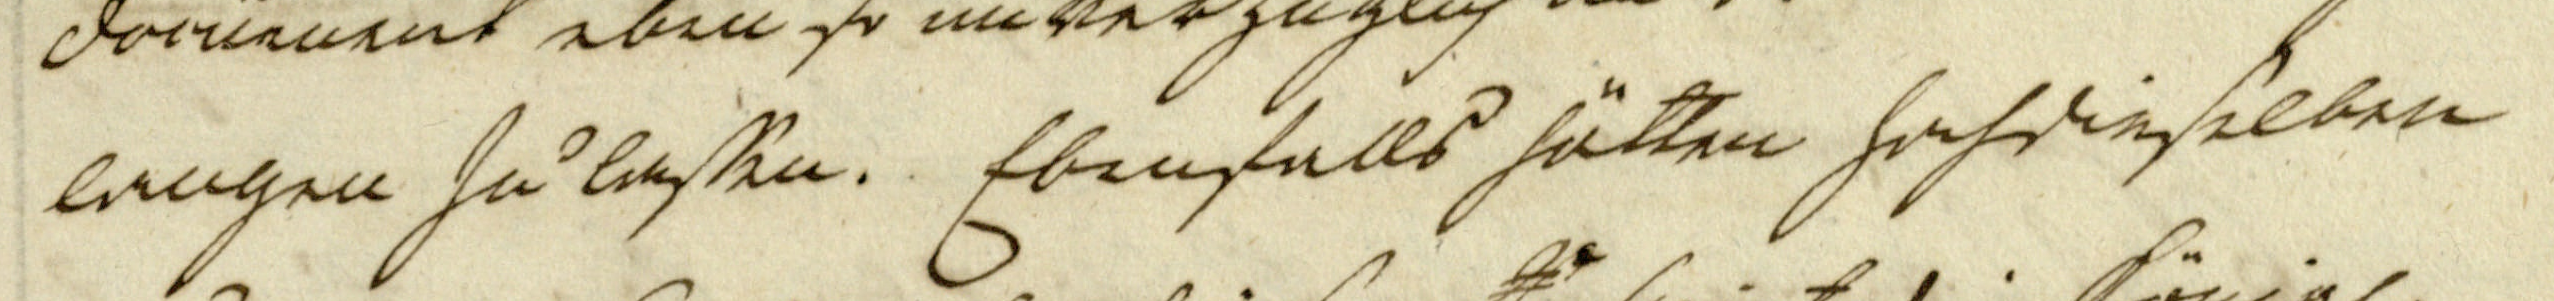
langen zu lassen. Ebenfalls hätten hochdieselben
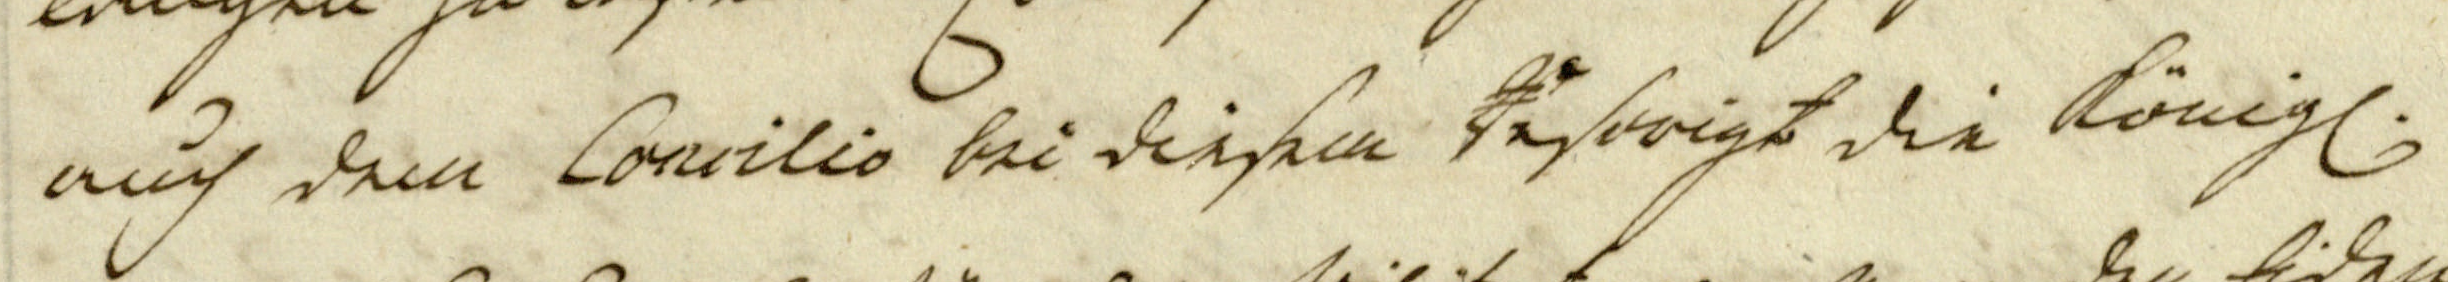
auch dem Concilio bei diesem Rescript die Königl.
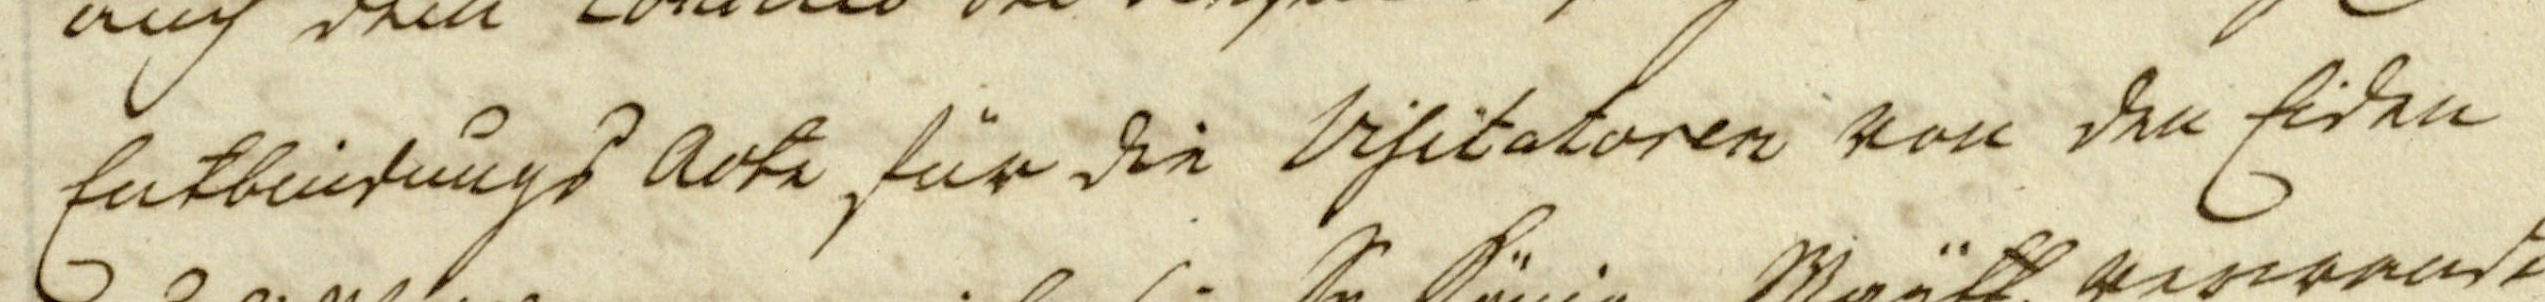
Entbindungs Acte für die Visitatoren von den Eiden
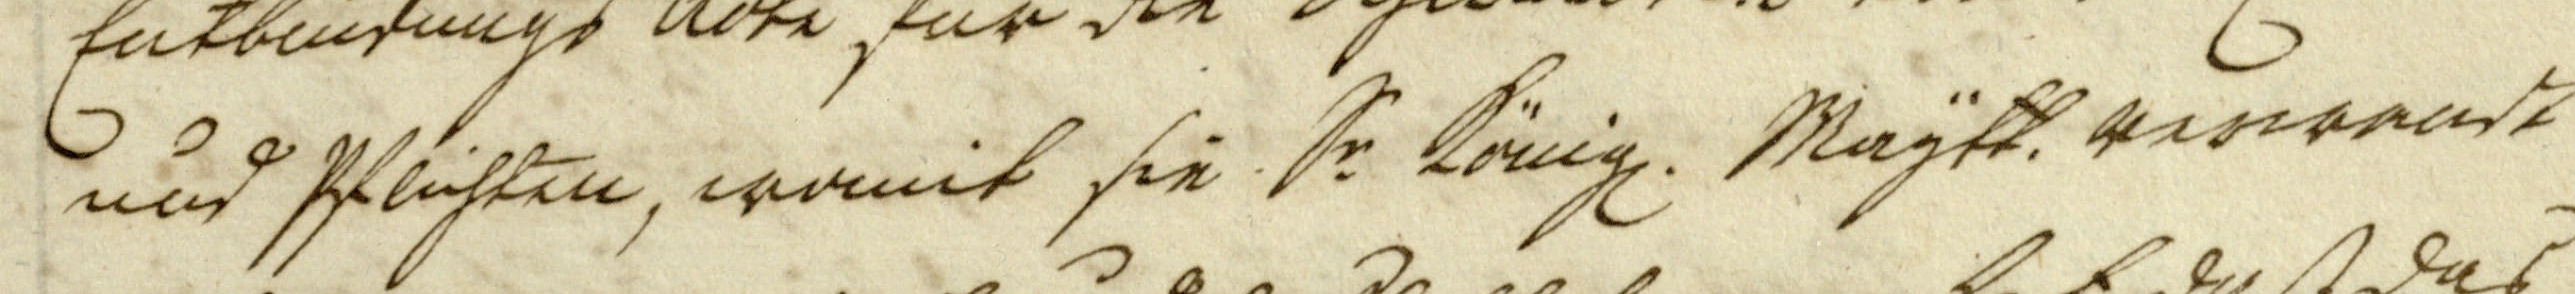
und Pflichten, womit sie Sr. Königl. Maÿtt. verwandt
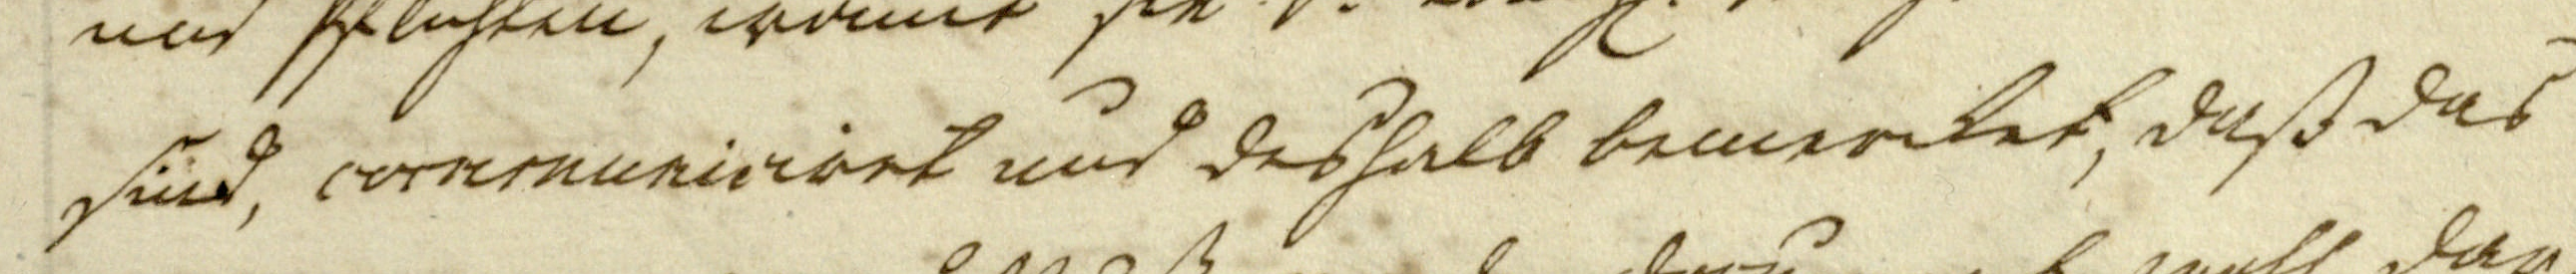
sind, communiciret und deshalb bemercket, daß das
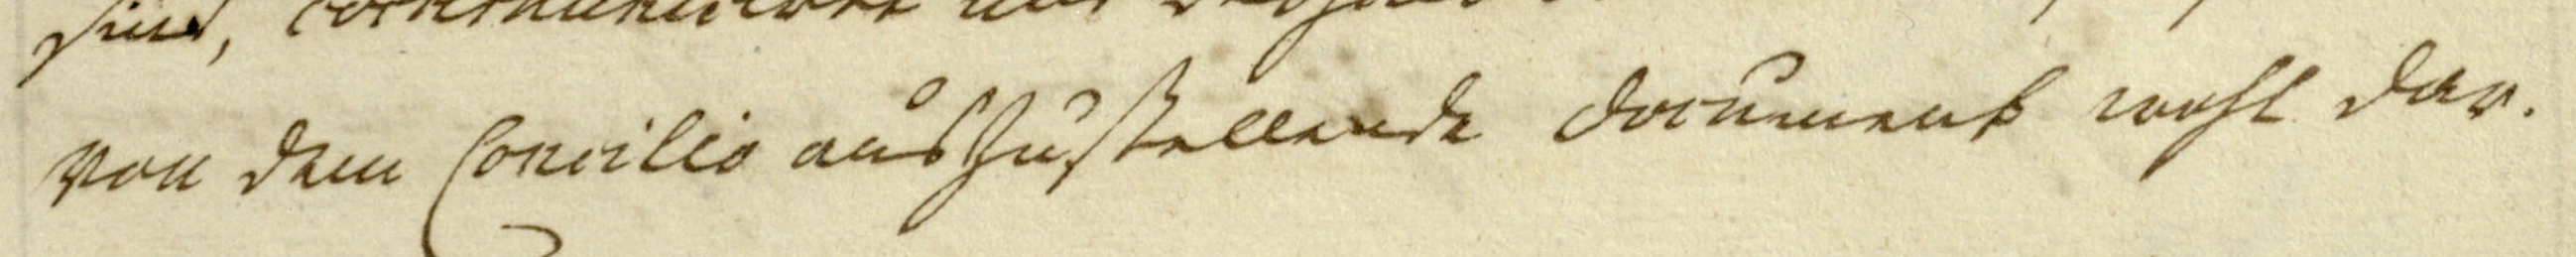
von dem Concilio auszustellende Document wohl dar¬
